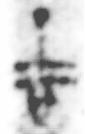吉
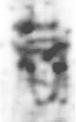君
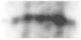一
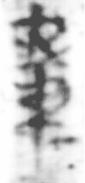騬
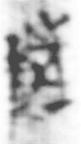廣
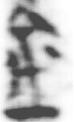金
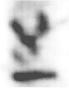之
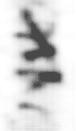○（飾）
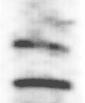二
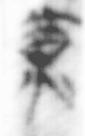黃
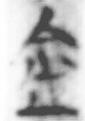金
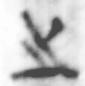之
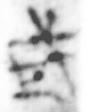○（飾）
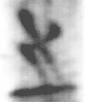之
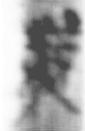無
